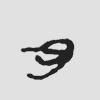月
